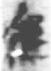○（紕）
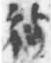紫
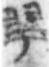○（羽）
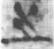之
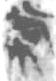常
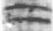二
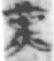黃
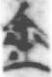金
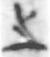之
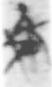○（伐）
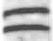二
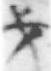戈
